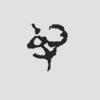{𢆶又}
